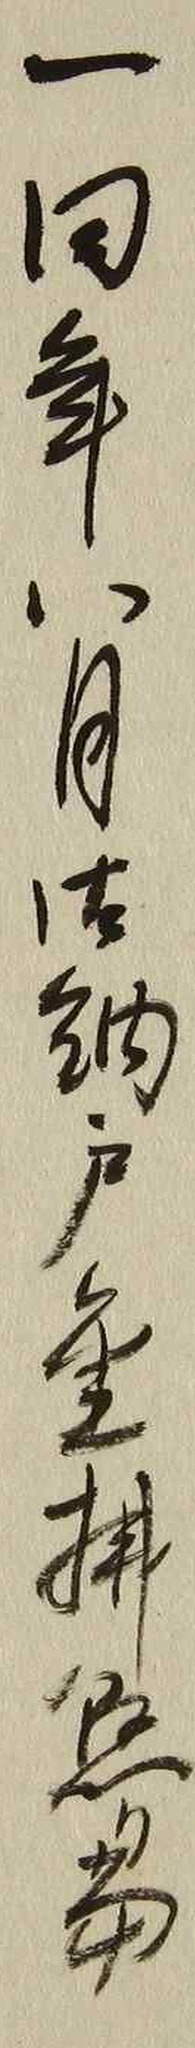一同年八月御納戸金払懸り当
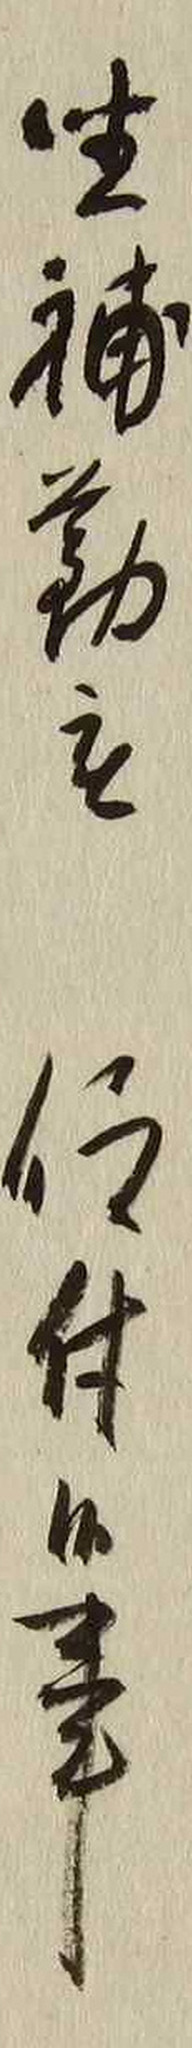坐補勤被仰付候事
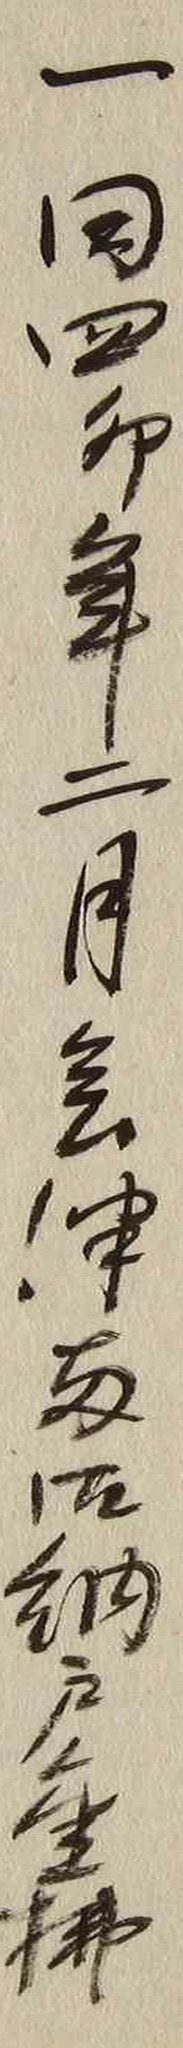一同四卯年二月会津両御納戸金払
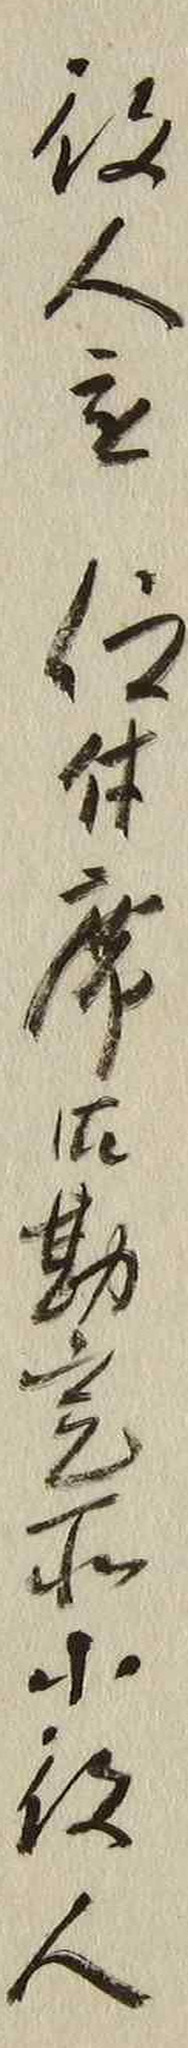役人被仰付席御勘定所小役人
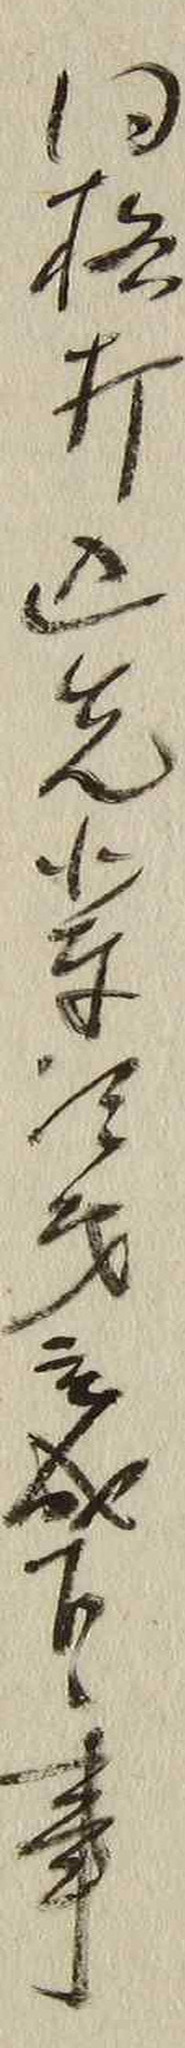同格打込先輩次第被成下候事
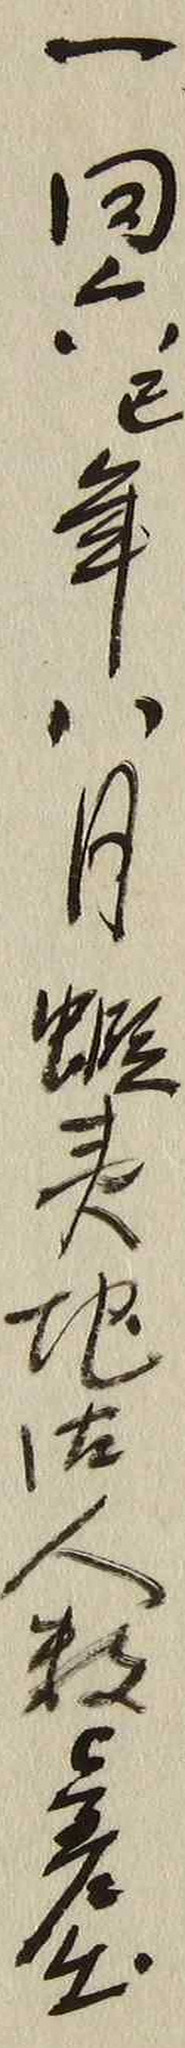一同六巳年八月蝦夷地御人数被差出
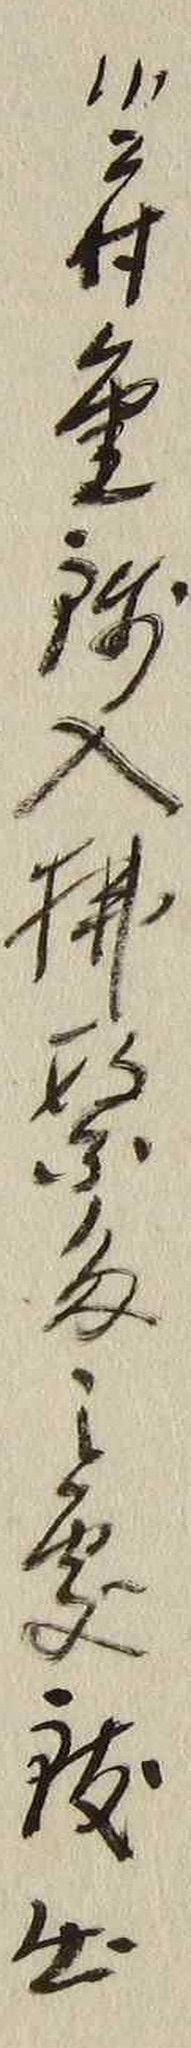候ニ付金銭入払繁多之処致出
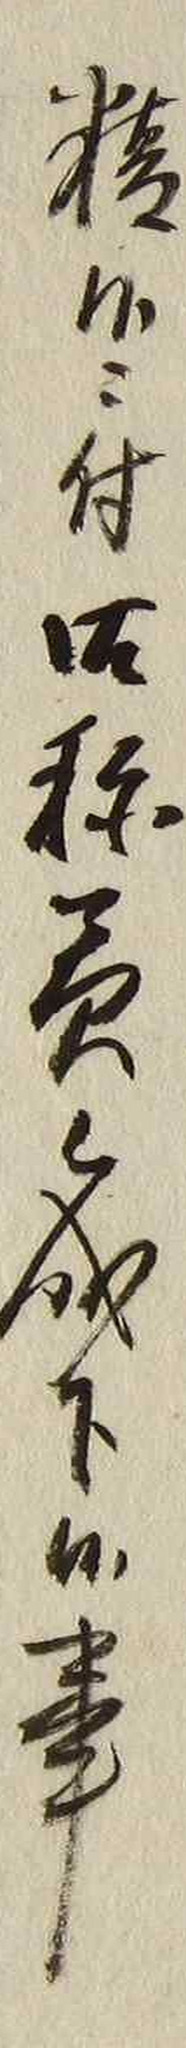精候ニ付御称美被成下候事
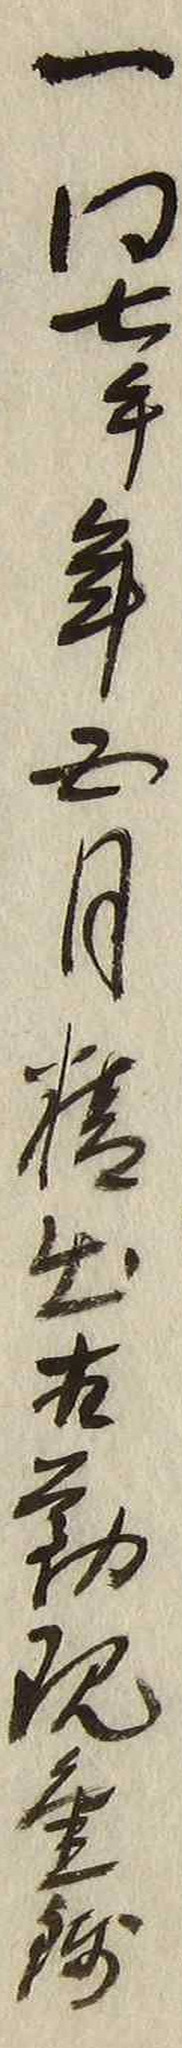一同七午年五月精出相勤現金銭
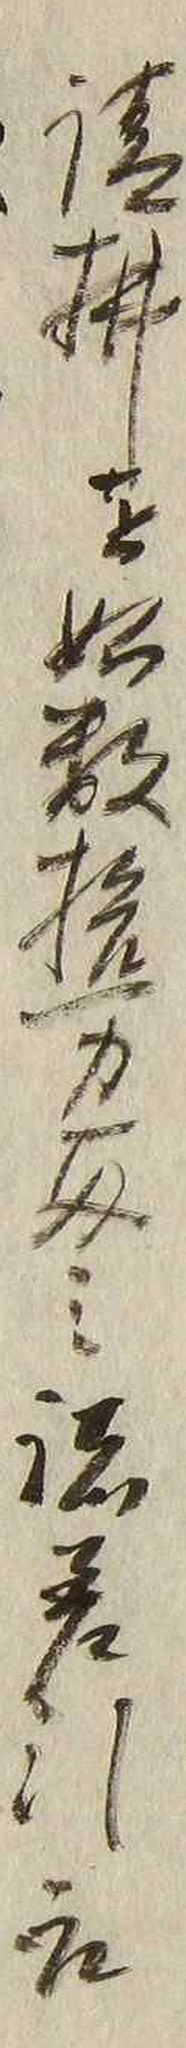請払を始数拾万両之諸差引取
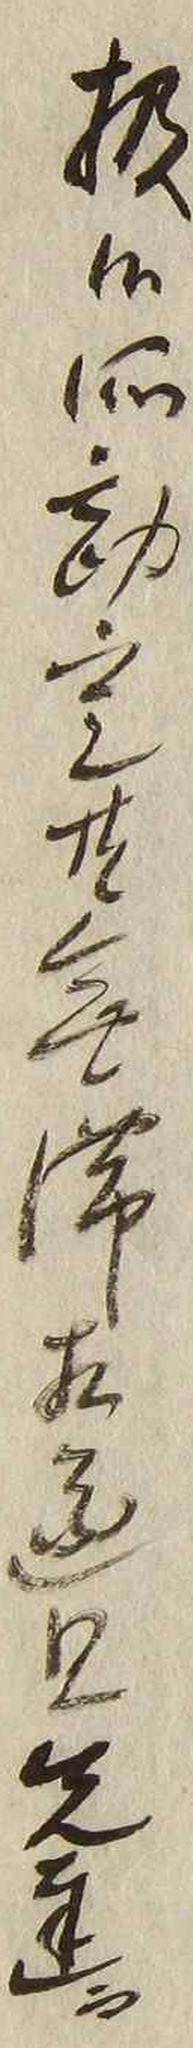扱候所勘定共無滞相遂且先達而

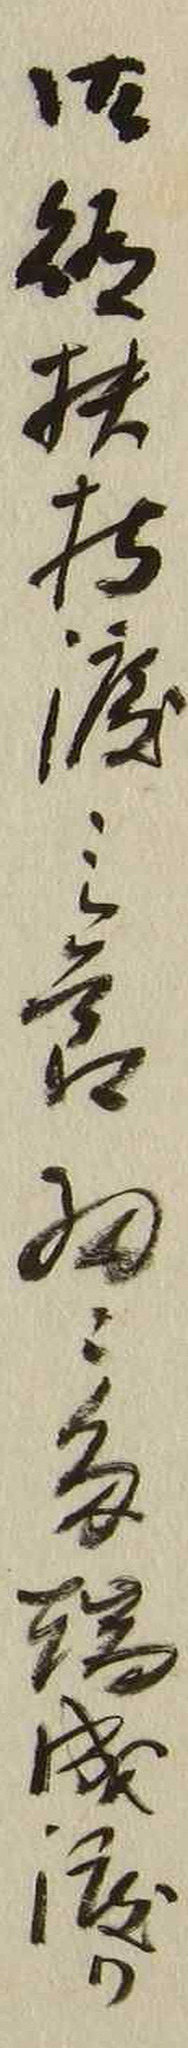御賄扶持渡之節細々多端成渡り
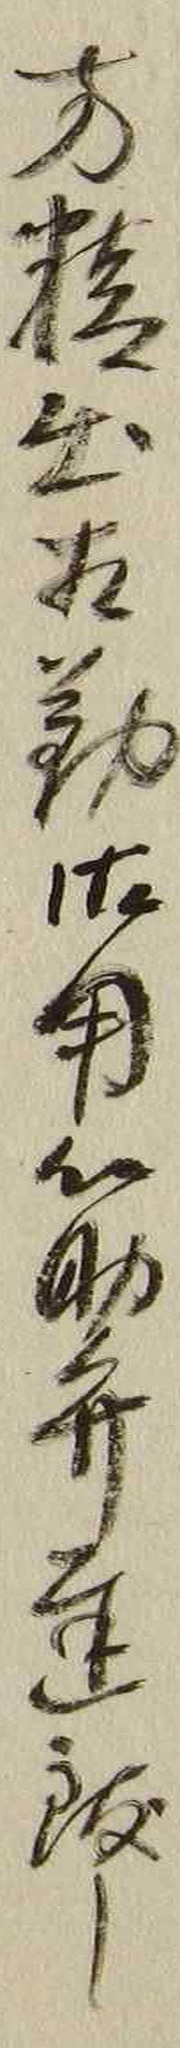方精出相勤御用筋弁達致し
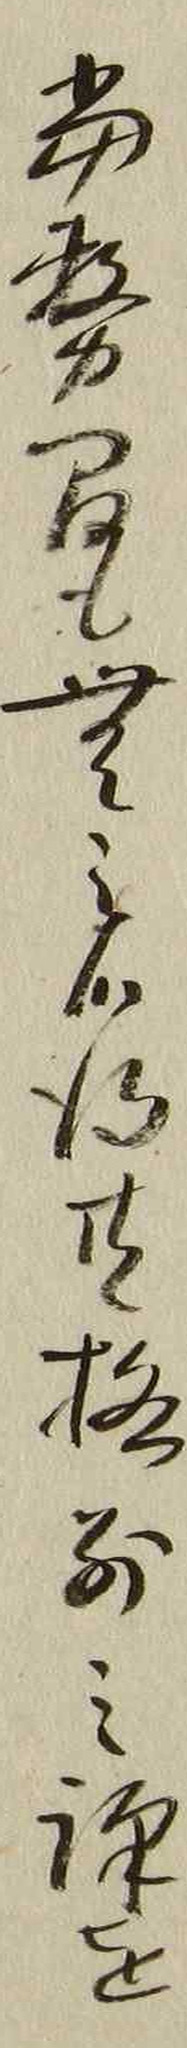当務間も無之候得共格別之訳を
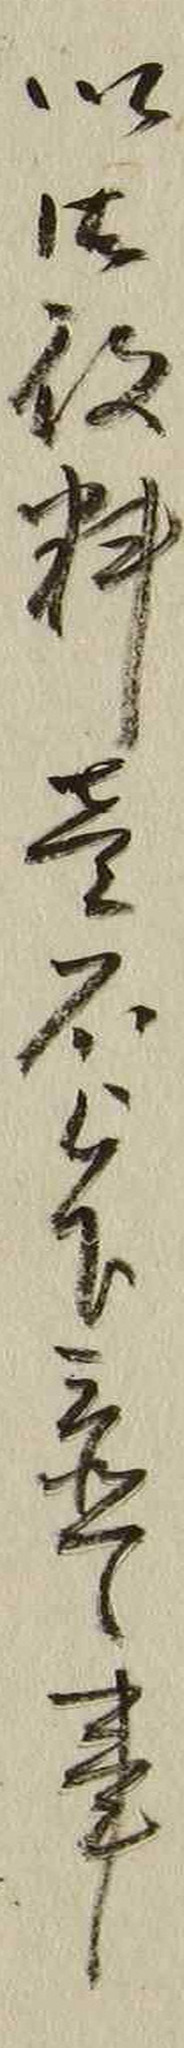以御役料壱石被下置候事
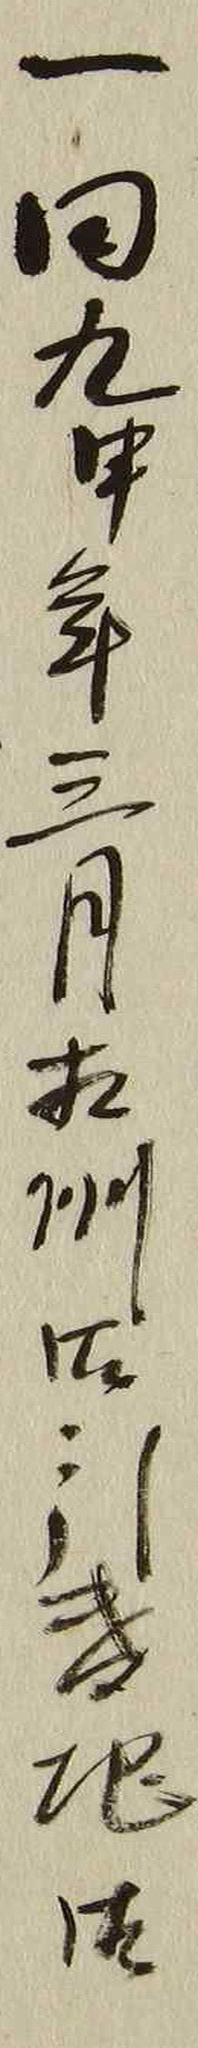一同九申年三月相州御引替地御
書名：諸士系譜　巻之353　す之部3
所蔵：会津若松市立会津図書館
